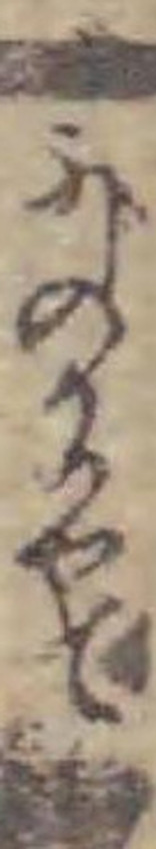ふじのかかやて
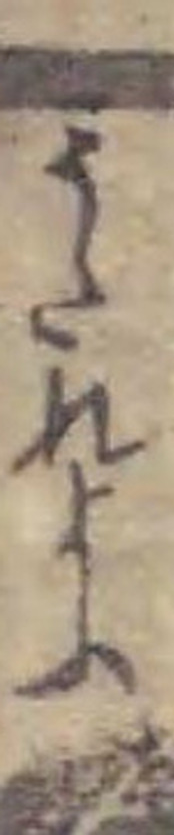うたれよふ
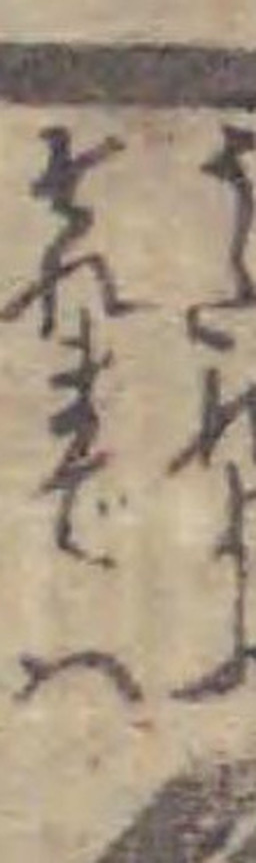それまでは
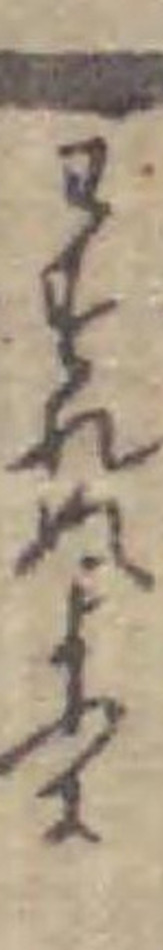わすれぬよふに
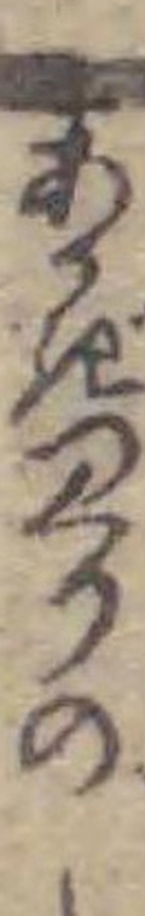あかぎつくりの
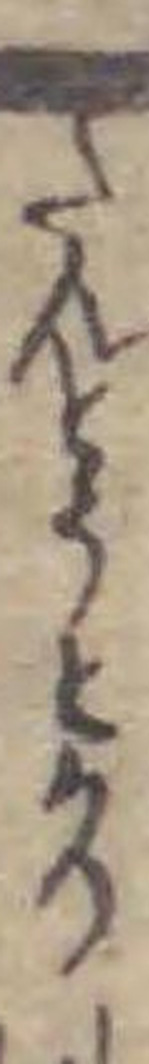たんとうとかり
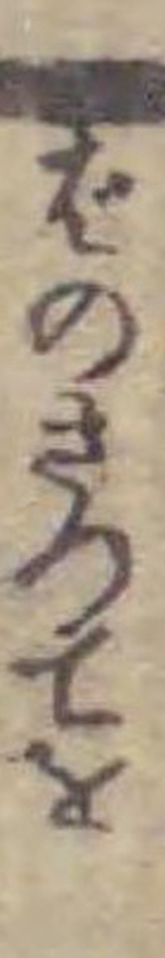ばのきつてを
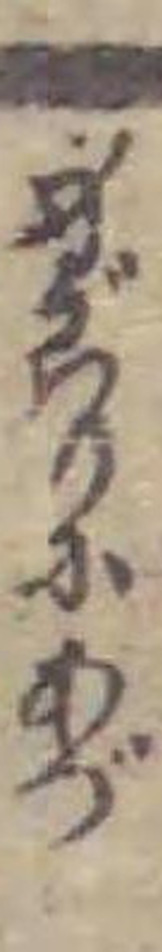身がはりにあづ
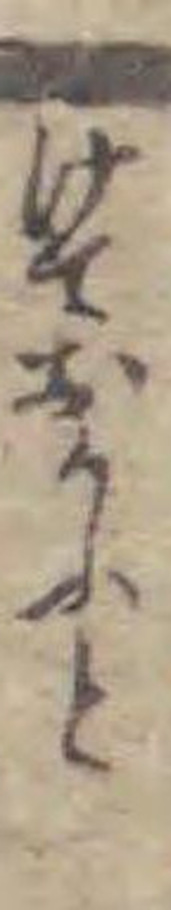けておかふと
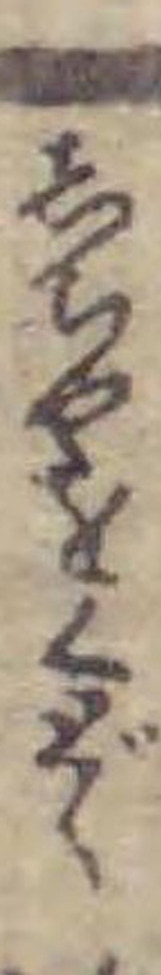しちやをくどく
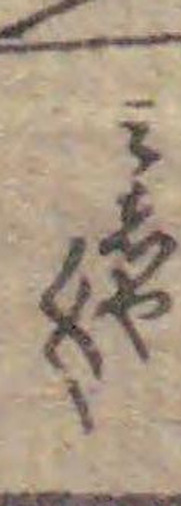みしや
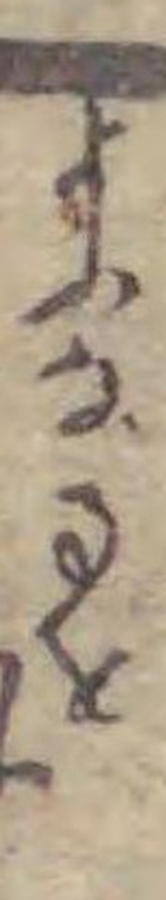よふな事を
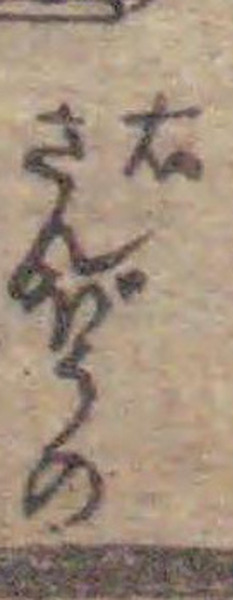さんぼうの
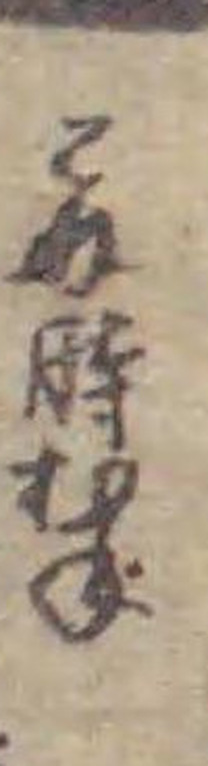この時むね
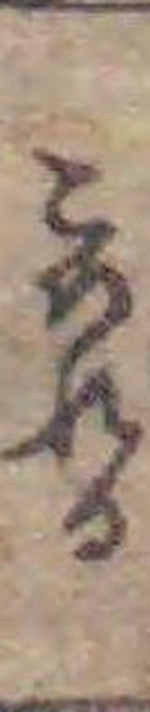こはれる
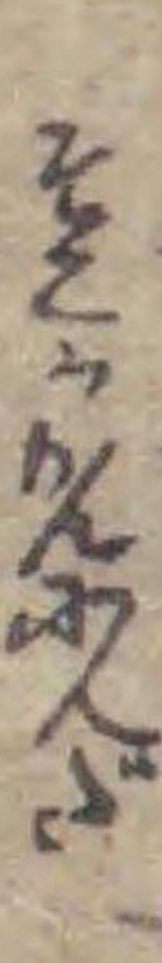そこかかんにんだ
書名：年寄之冷水曽我 : 3巻
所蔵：国立国会図書館 National Diet Library, JAPAN
